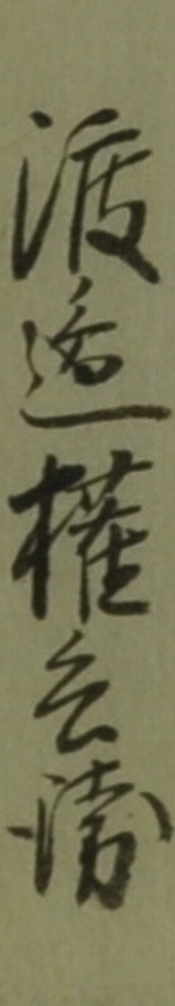渡辺権兵衛
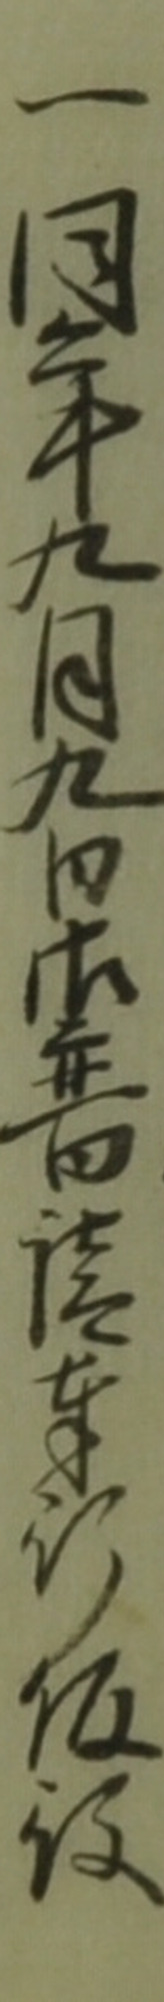一同年九月九日御普請奉行仮役
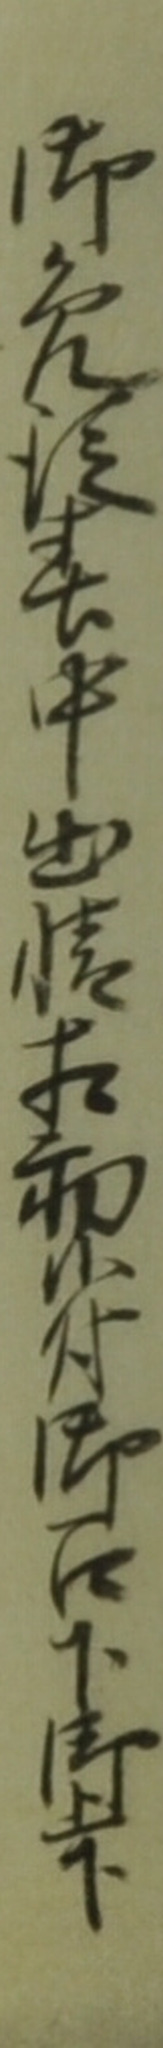御免後春中出精相勤候付御召下御上下

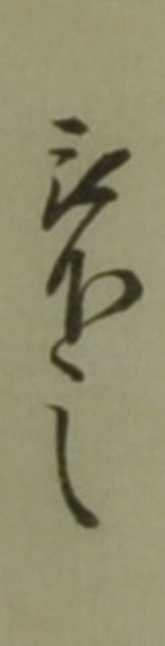被下之
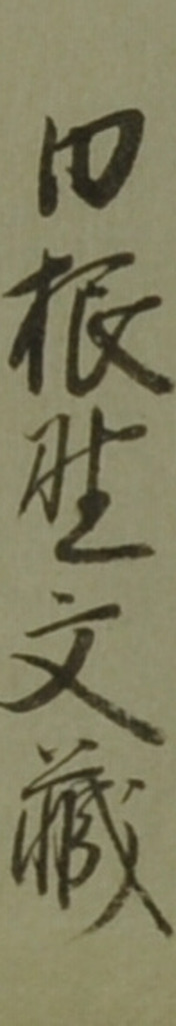日根野文蔵
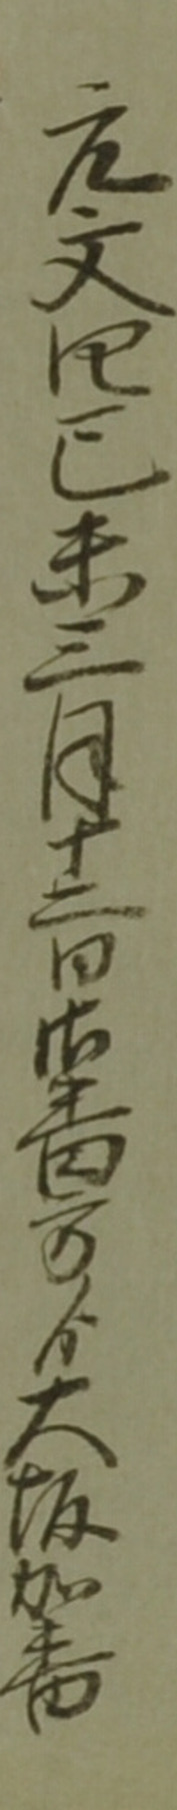一元文四己未三月十二日御番方ゟ大坂加番
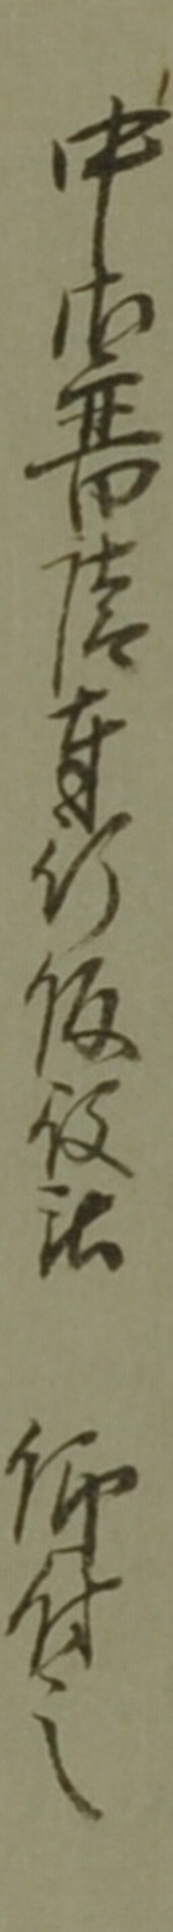中御普請奉行仮役被仰付之
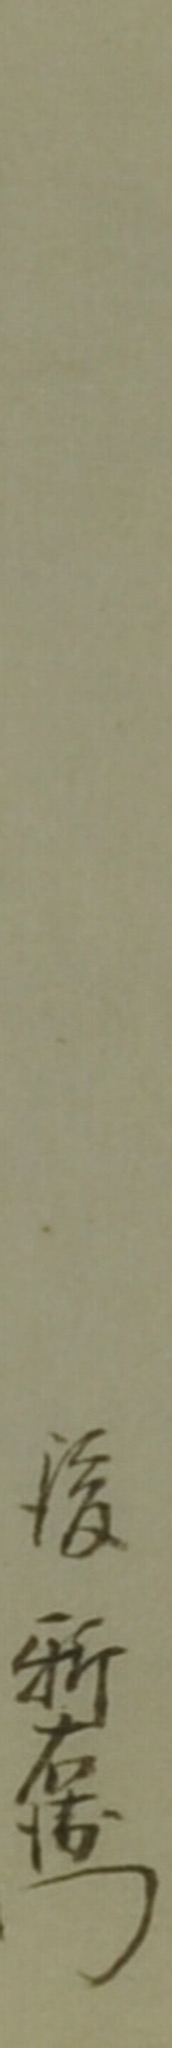後新右衛門
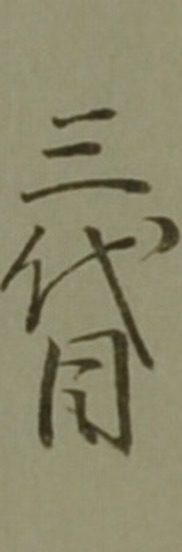三代目
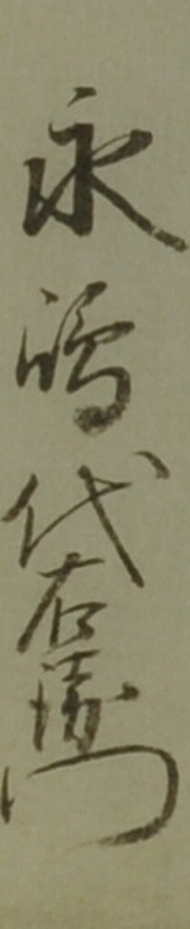永嶋代右衛門
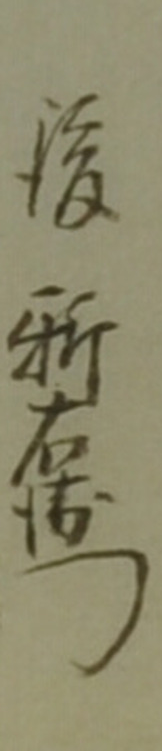後新右衛門
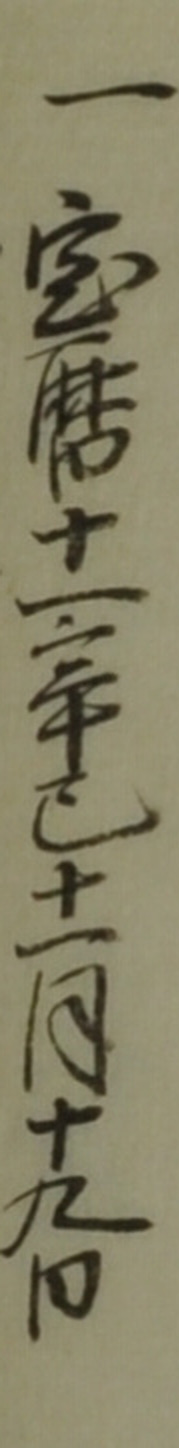一宝暦十一辛巳十一月十九日
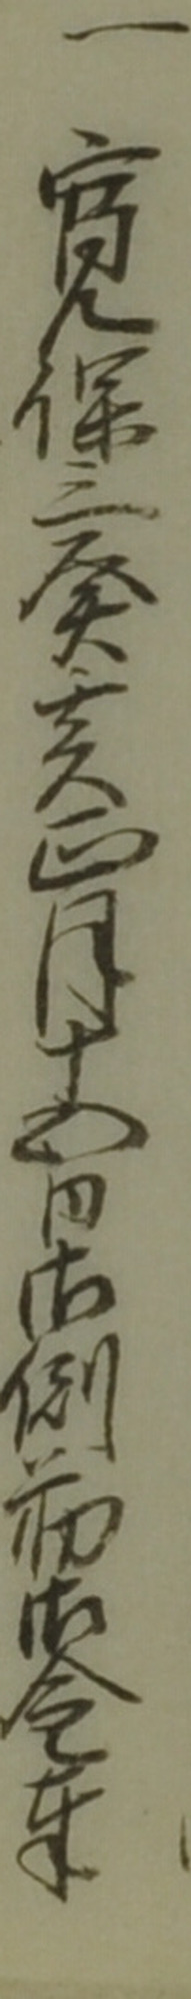一寛保三癸亥正月十五日御側勤御金奉
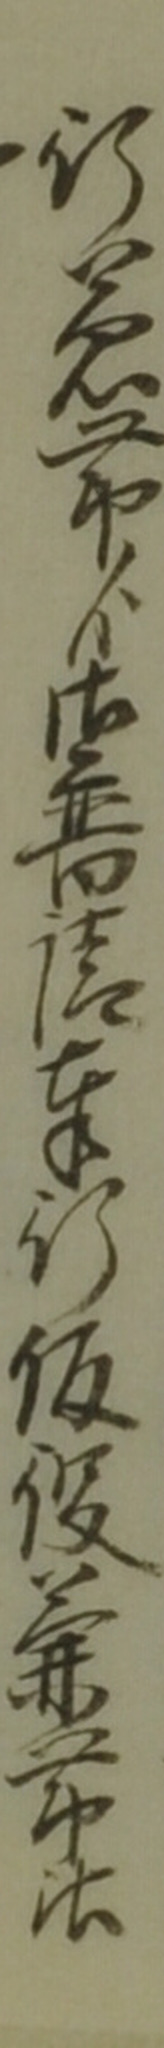行兼帯ゟ御普請奉行仮役兼帯被
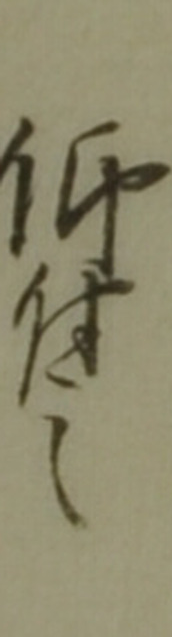仰付之
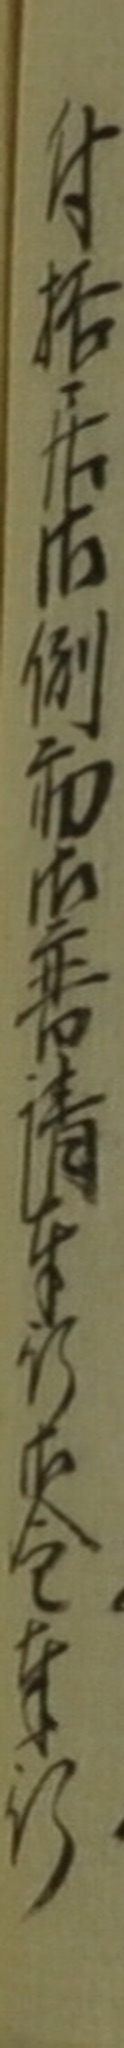付格居御側勤御普請奉行御金奉行
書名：諸御役代々録（六）
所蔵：伊那市立高遠町図書館・合同会社AMANE
